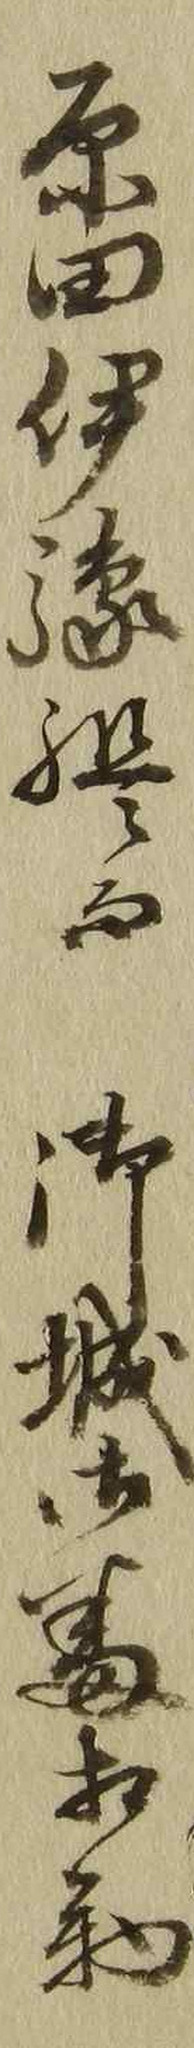原田伊予組ニ而御城御番相勤
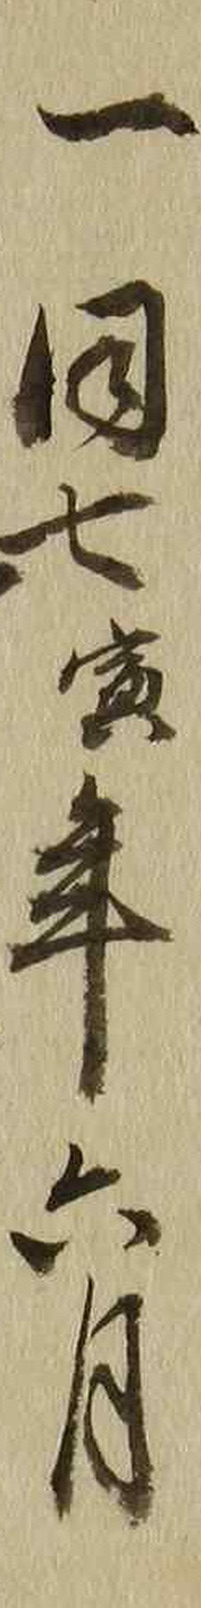一同七寅年六月
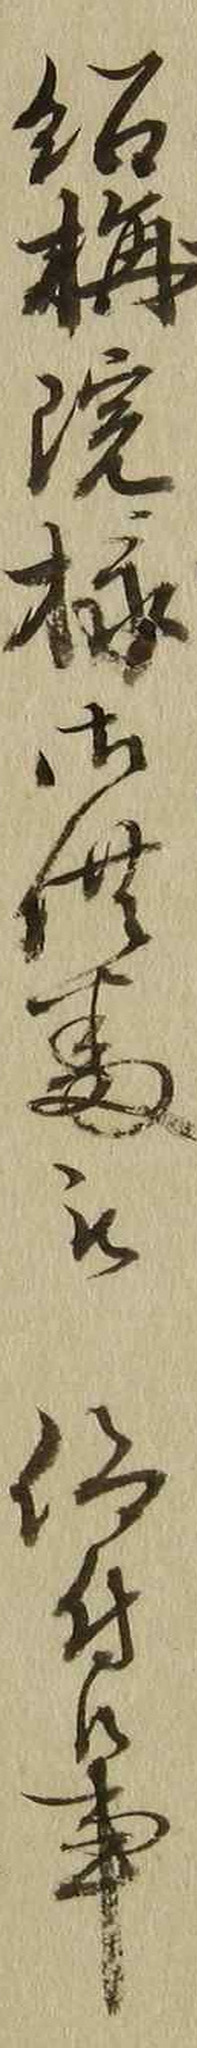紹栴院様御供番被仰付候事
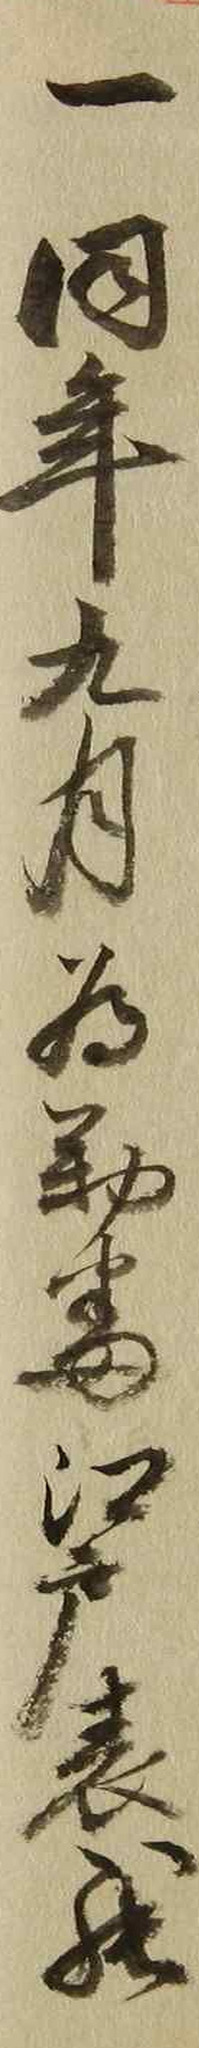一同年九月為勤番江戸表ヘ罷
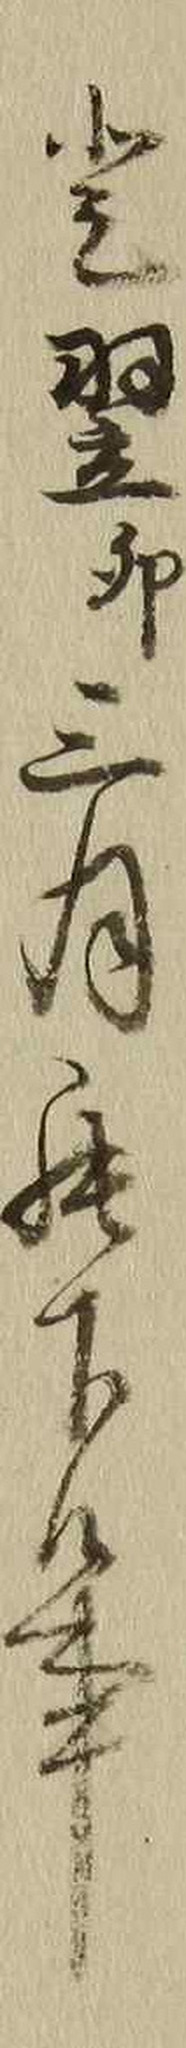登翌卯年三月罷下候事
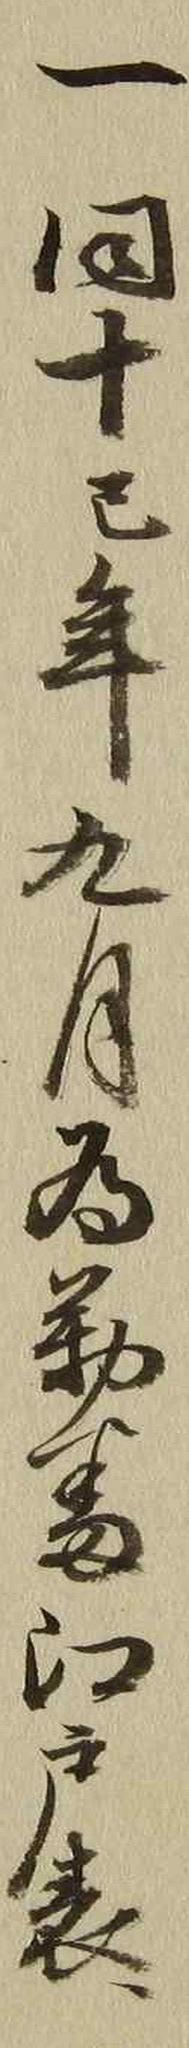一同十巳年九月為勤番江戸表ヘ
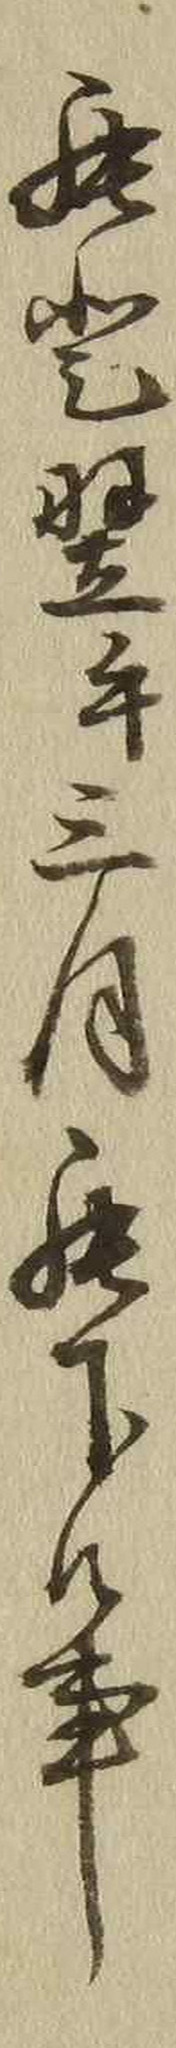罷登翌午三月罷下候事
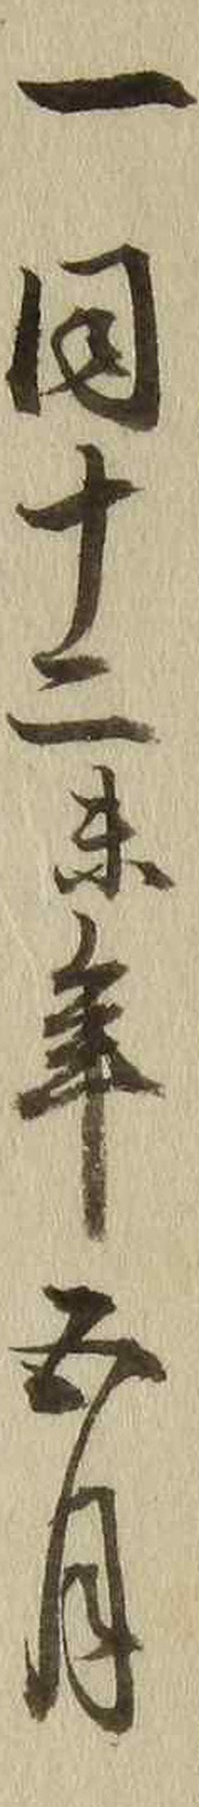一同十二未年五月
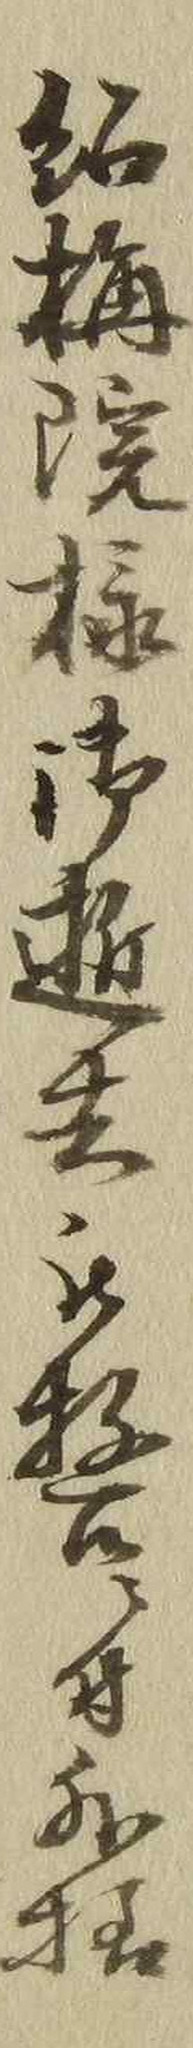紹栴院様御逝去被遊候ニ付外様
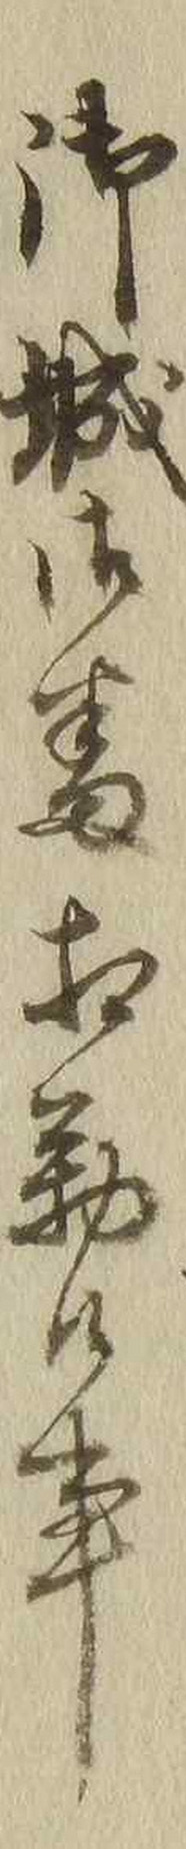御城御番相勤候事
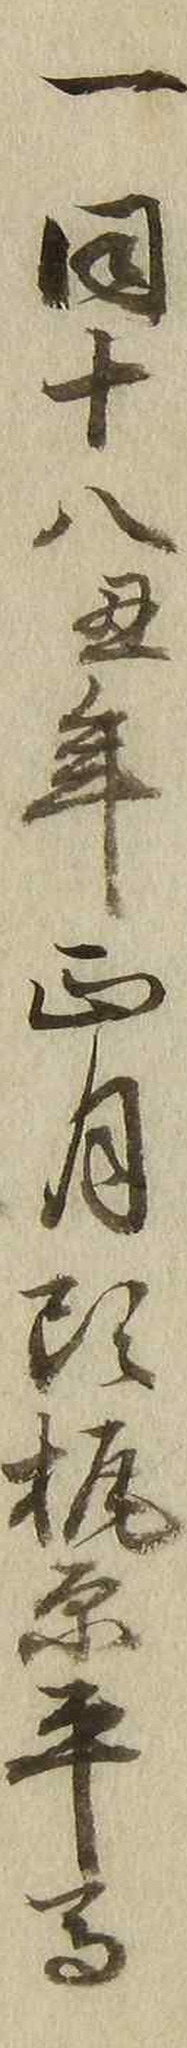一同十八丑年正月頭梶原平馬
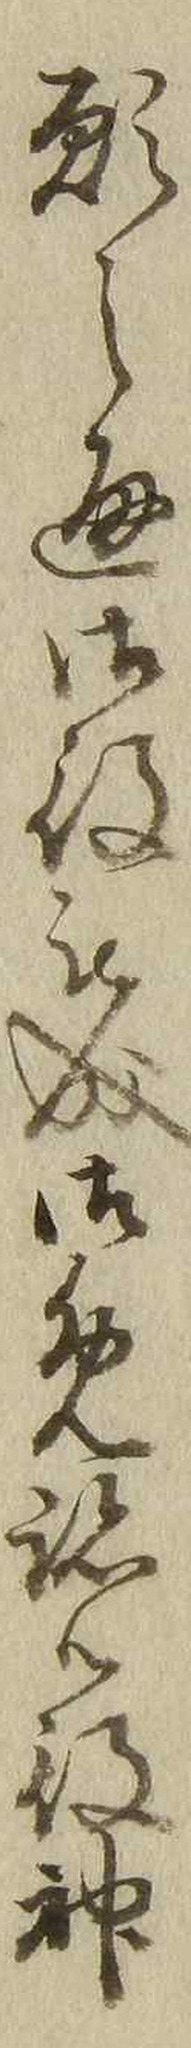願之通御役被成御免諸御役神
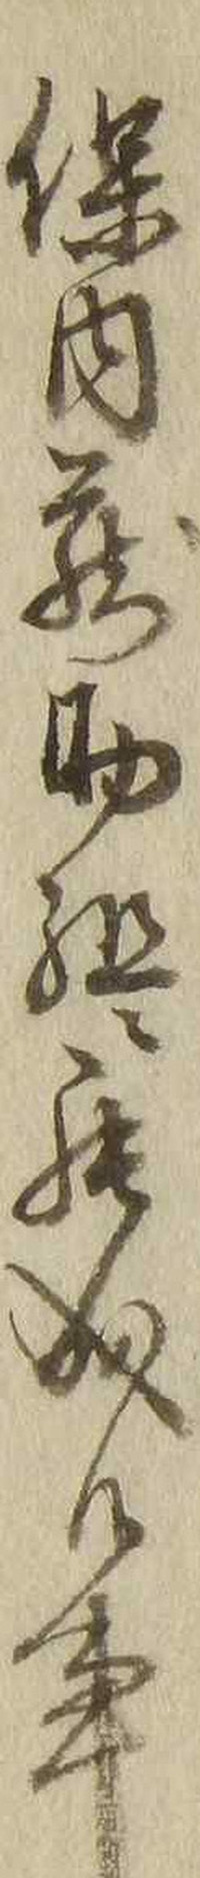保内蔵助組ニ罷成候事

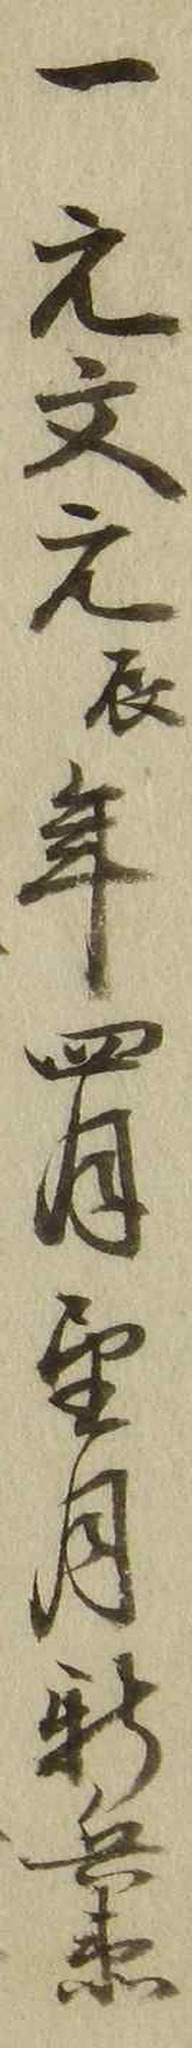一元文元辰年四月望月新兵衛
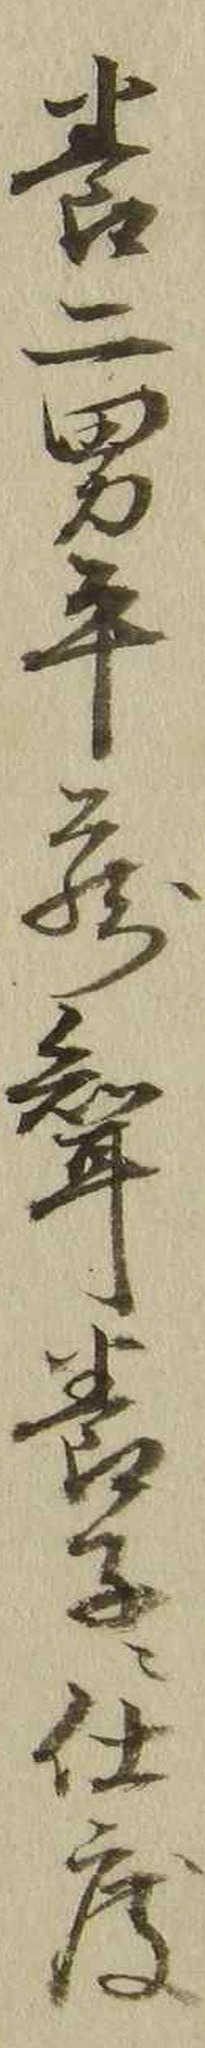養二男平蔵婿養子ニ仕度
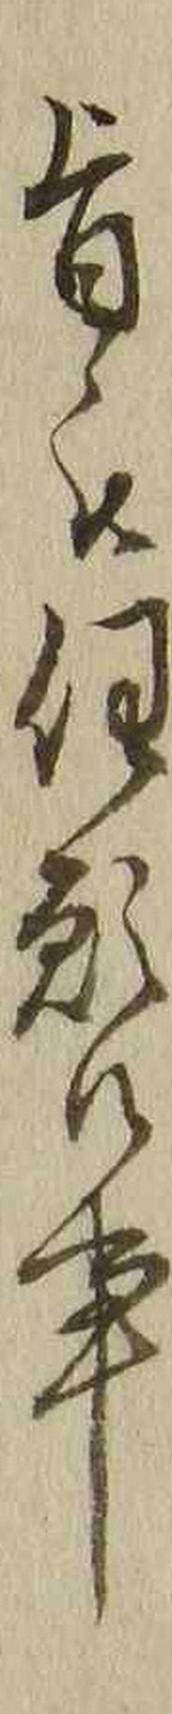旨被伺願候事
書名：諸士系譜　巻之64　と之部7
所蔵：会津若松市立会津図書館
